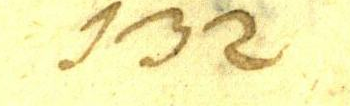132
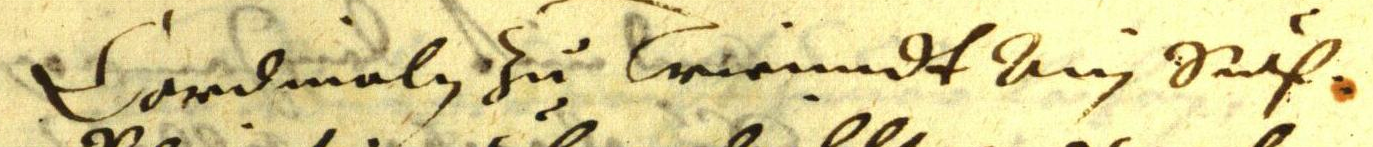Cardinaln Zū Trienndt Ain Sūp¬
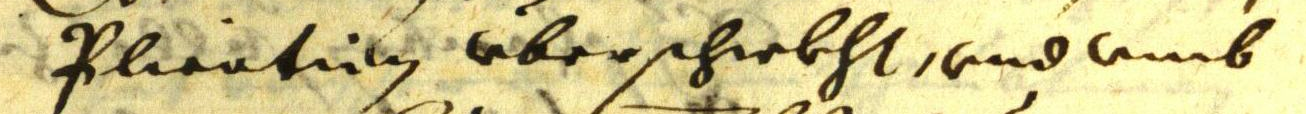Plication v̄berschickht, vnd vmb
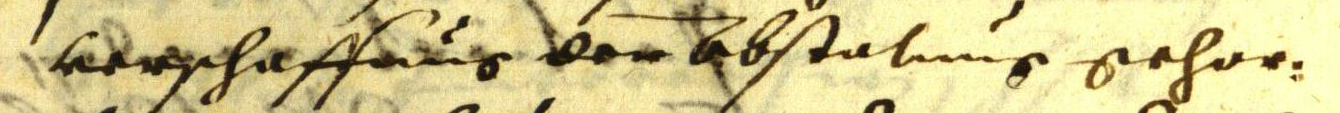verschaffūng der Abstatūng gehor¬
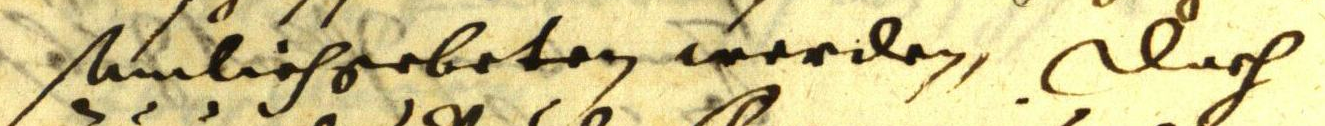samlich gebeten werden, Doch
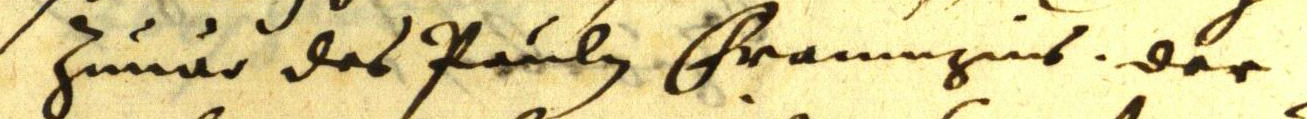Zūūor des Paūln Frannzins. der
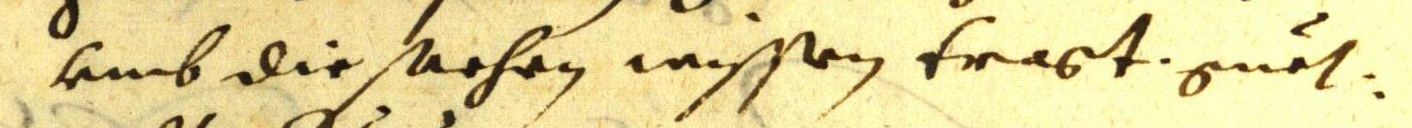vmb die sachen wissen tragt. gūet¬
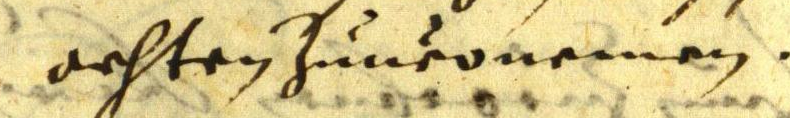achten Zūūernemen.
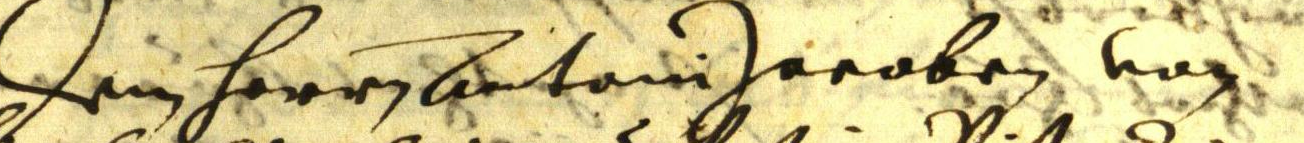Dem herrn Antoni Jacoben von
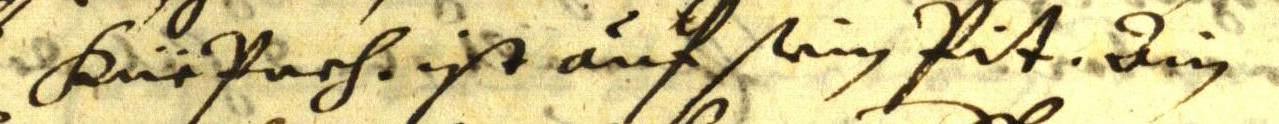KüePach ist aūf sein Pit. Ain
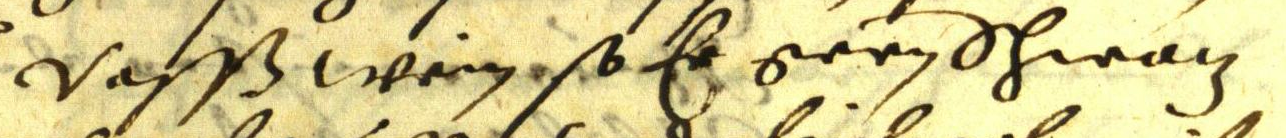Vasß Wein so Er geen Schwaz
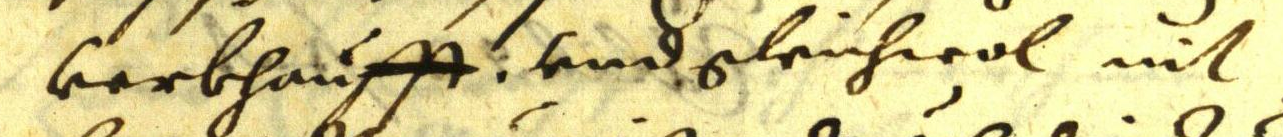verkhaūfft. vnd gleichwol nit
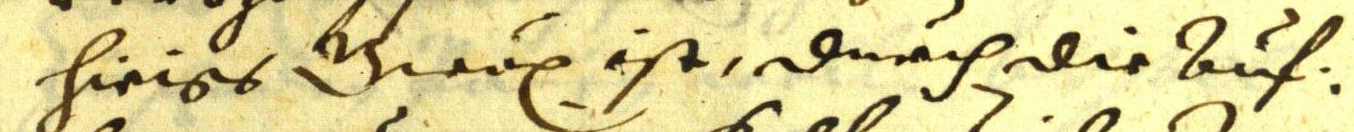hieigs Gwāx ist, dūrch die Aūf¬
